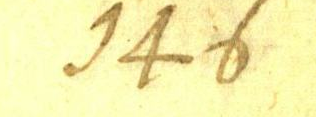146
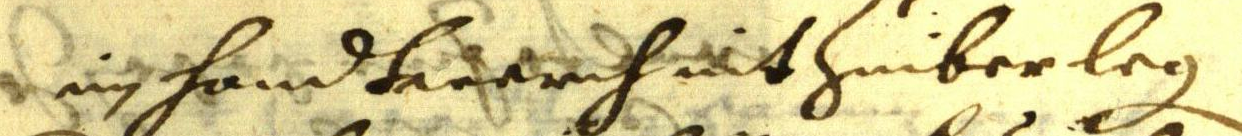im handtwerch nit Zūiber leg.
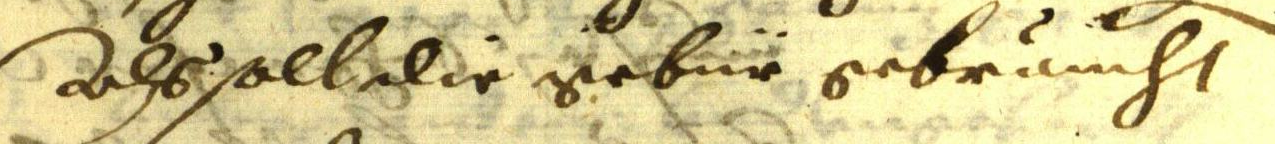Als soll die gebür gebraūcht
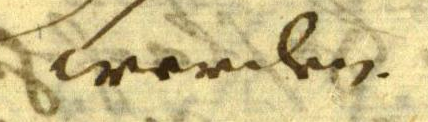werden.
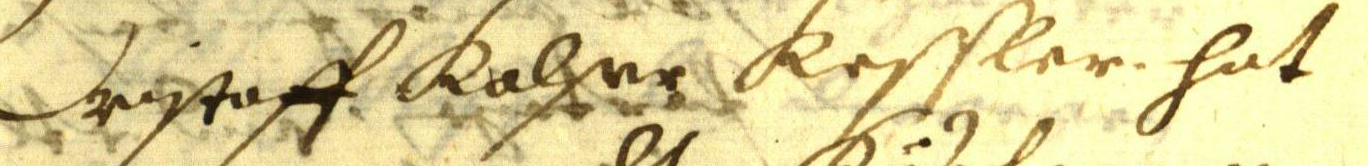Cristoff Kalser Kessler. hat
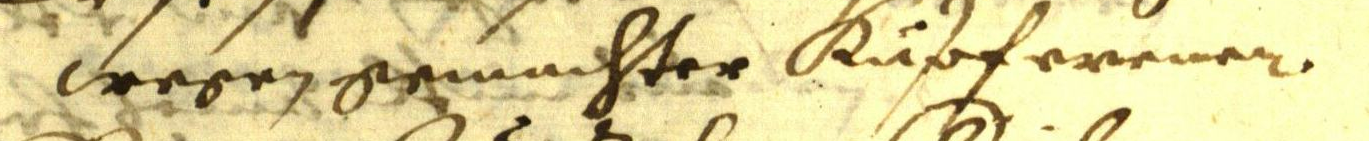wegen gemachter Kūpferener.
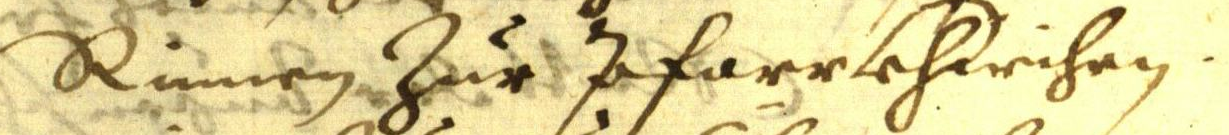Rinnen Zūr pfarrkhirchen
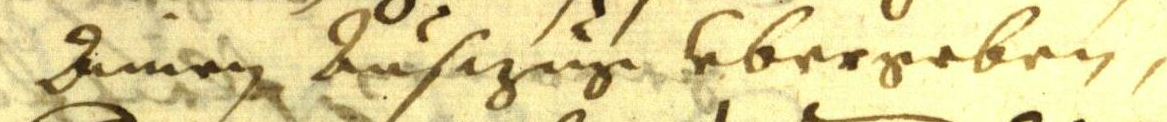Ainen Aūszūg v̄bergeben,
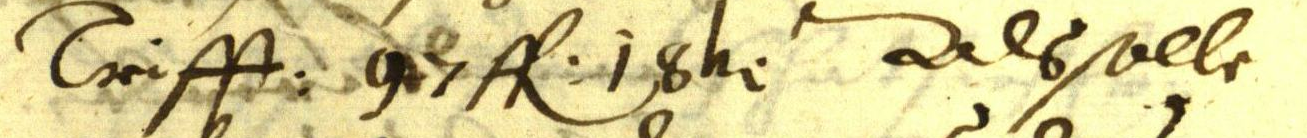Trifft: 97 fl: 18 k. Als solle
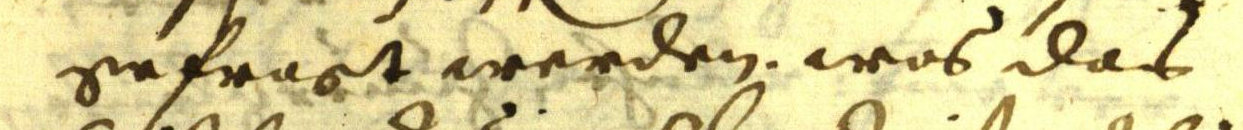gefragt werden. was das
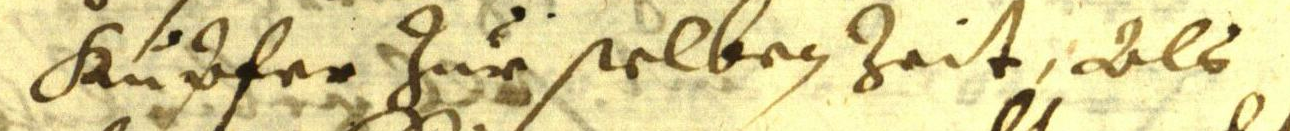Kūpfer Zūr selben Zeit, Als
